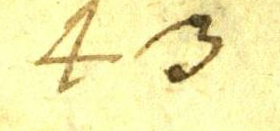43
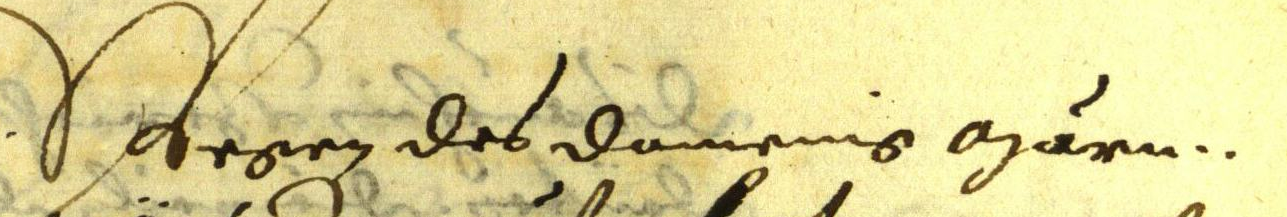Wegen des domenig Märn¬
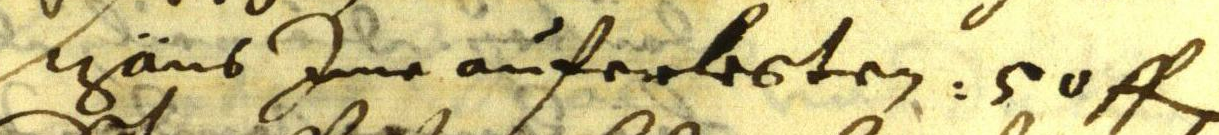zäns Ime aūferlegten: 50 fl
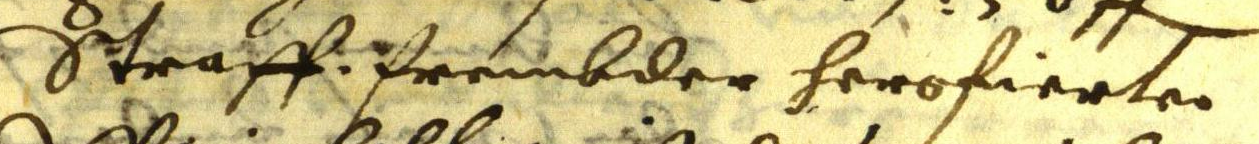Straff. frembder hergfierter
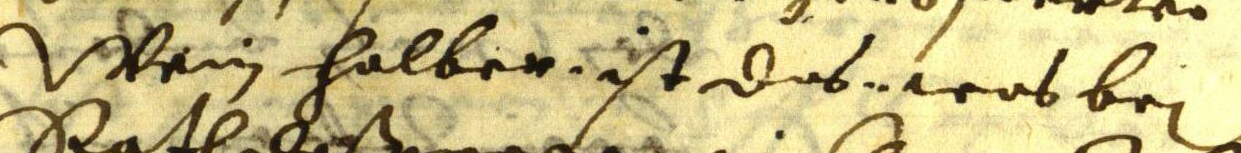Wein halber. ist das: was bei
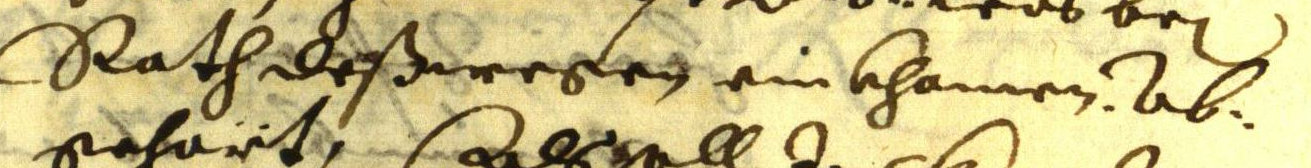Rath deßwegen ein khomen. Ab¬
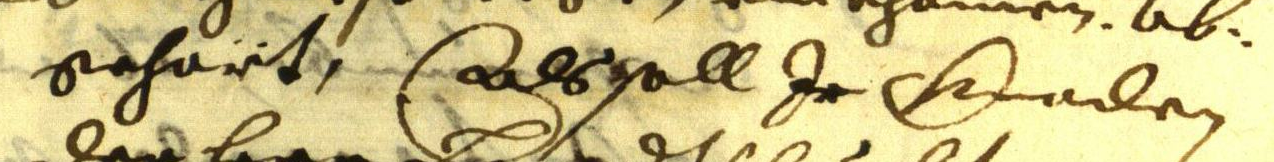gehört, Als soll Ir Gnaden
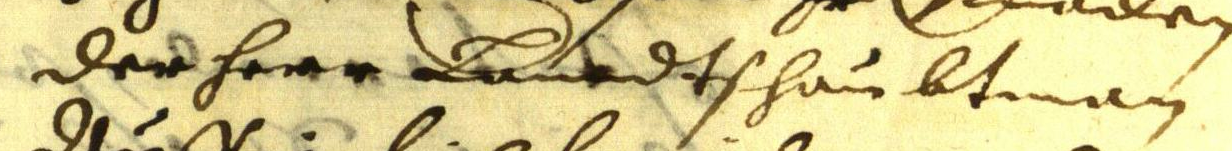der herr Lanndtshaūbtman
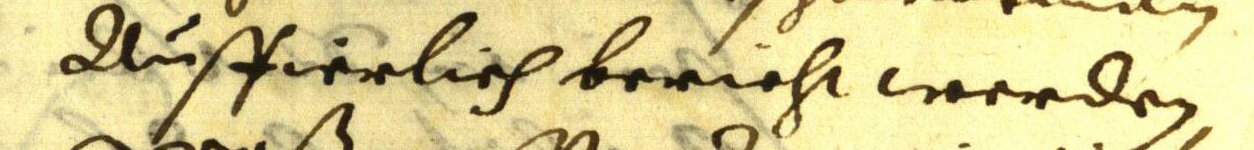Aūsfierlich bericht werden.
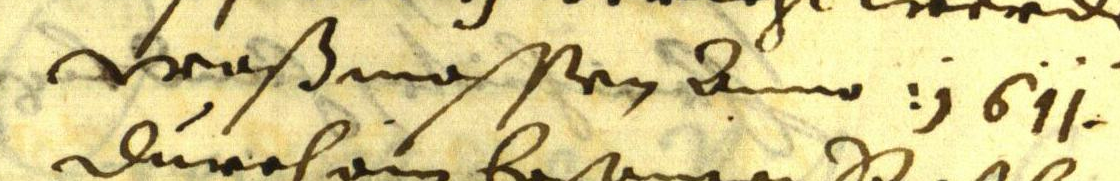Waßmassen Anno: 1611. t
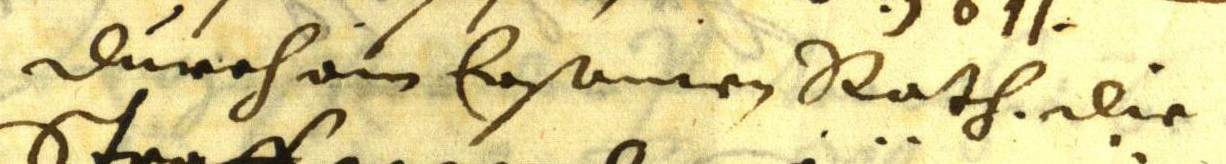dūrch ain Ersamen Rath. die
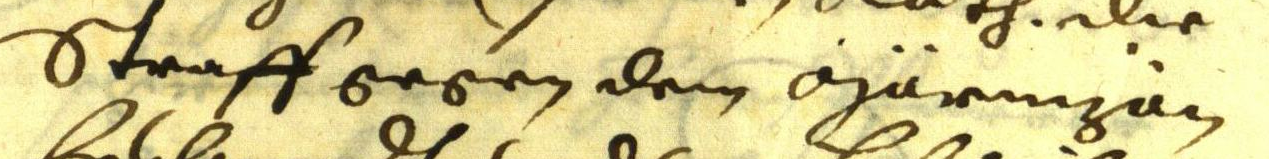Straff gegen dem Märnzän
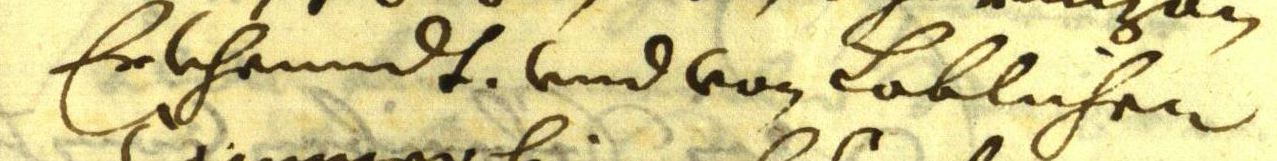Erkhenndt. vnd von Loblichen
